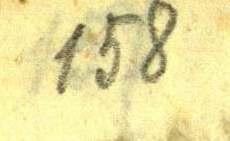158
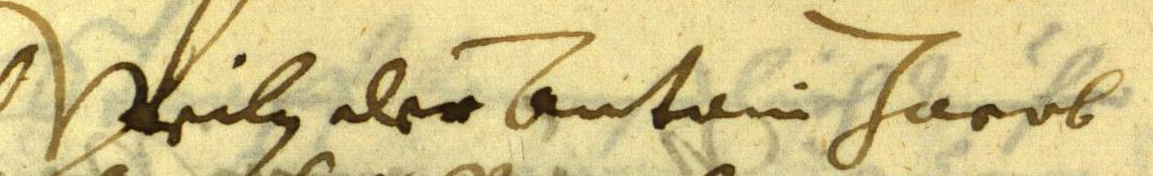Weiln der Antoni Jacob
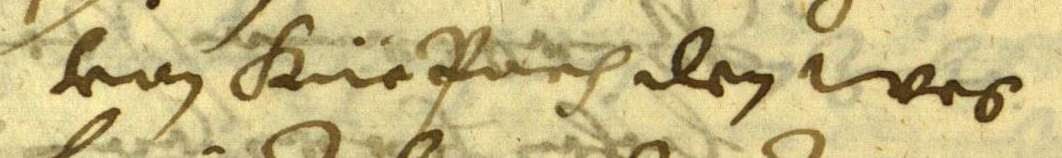von Küe Pach den Weg
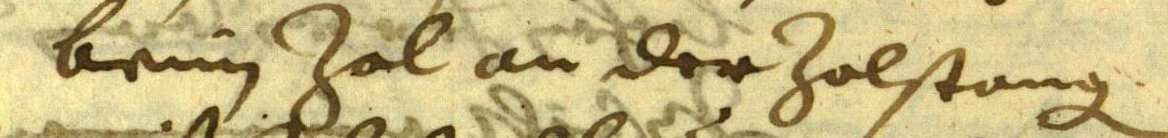beim Zol an der Zolstang
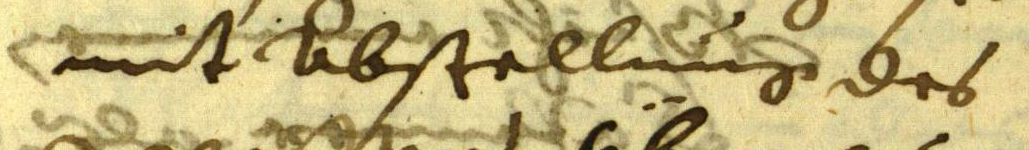mit Abstellūng des
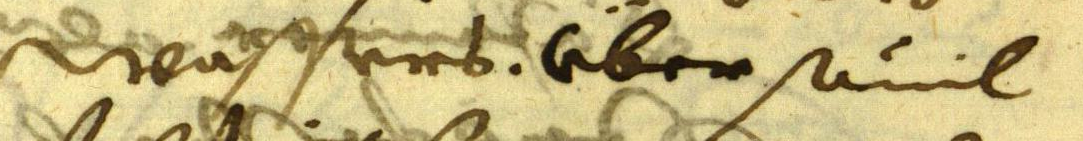Wassers. v̈ber soūil
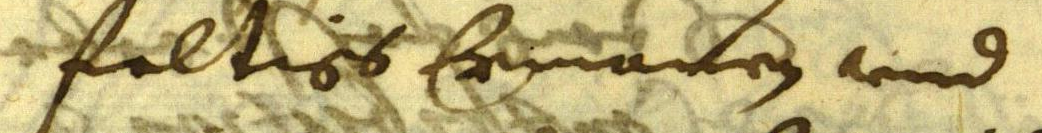feltigs Ermanen vnd
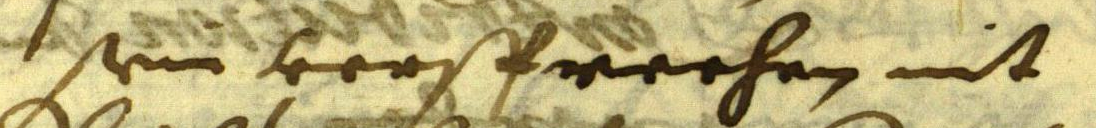sein versprechen nit
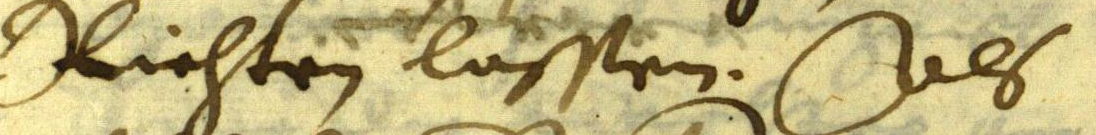Richten lassen. Als
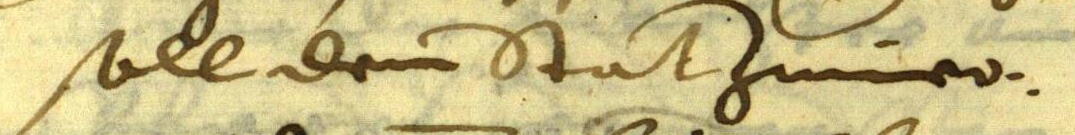soll dem Stat Zimer¬
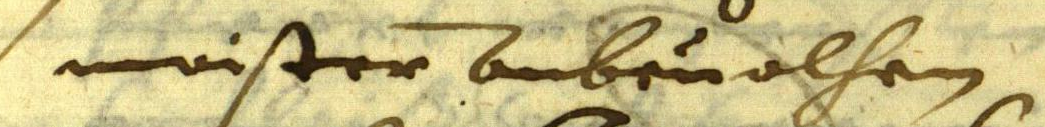maister Anbeūolhen
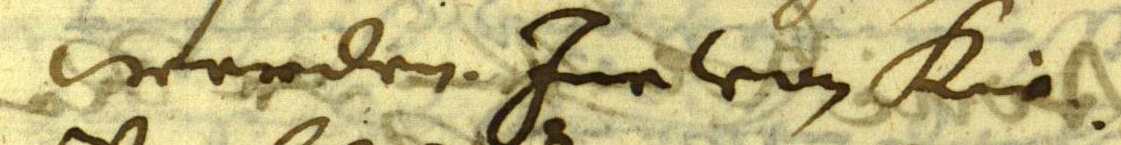werden. Ine von Kie¬
